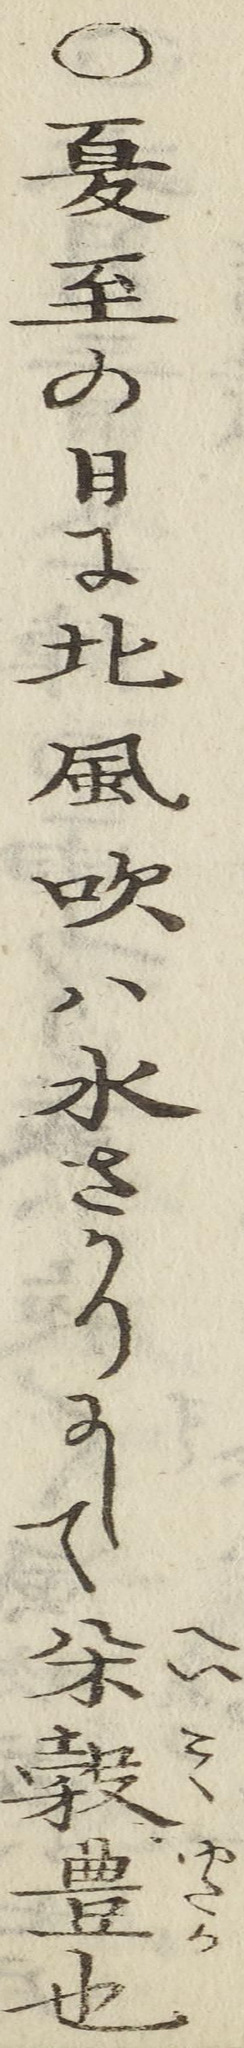○夏至の日に北風吹は水さかりにして米穀豊也
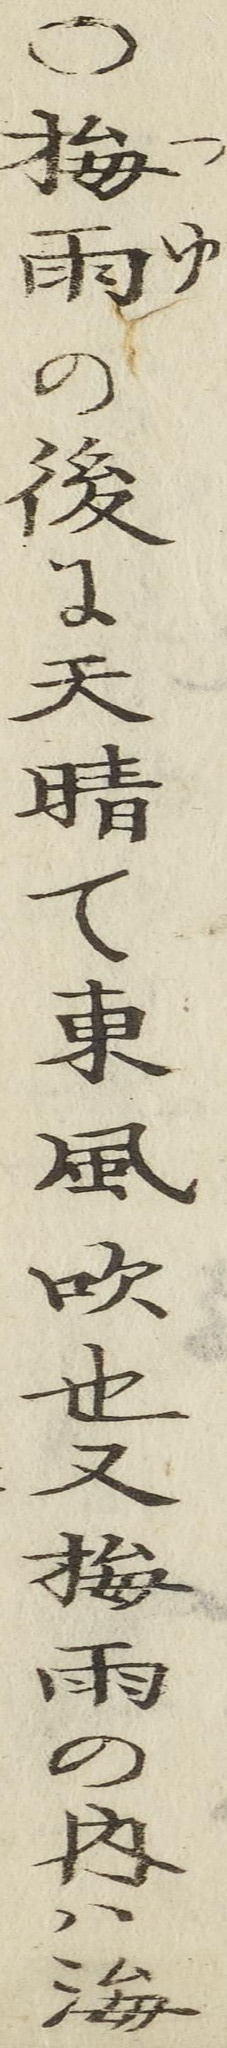○梅雨の後に天晴て東風吹也又梅雨の内は海
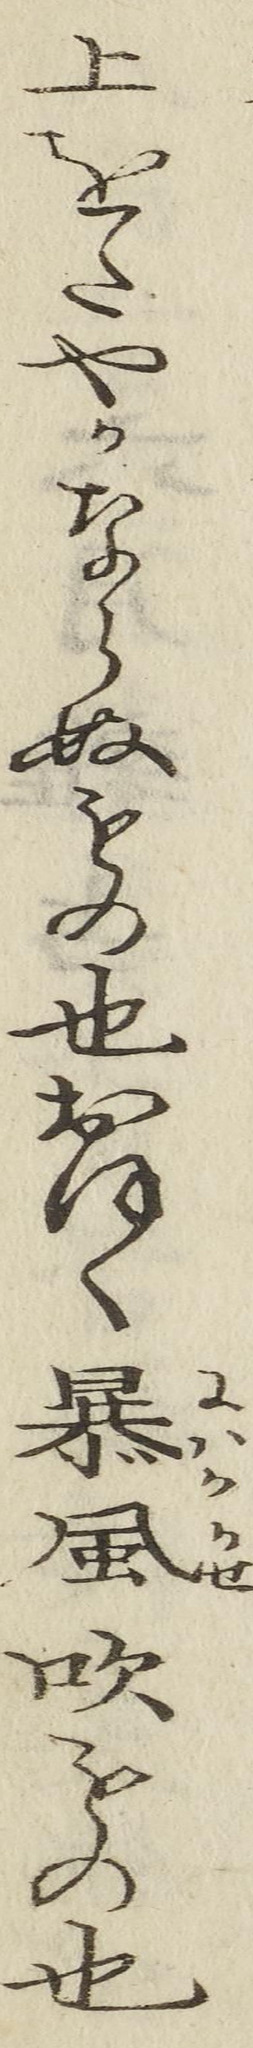上をたやかならぬもの也おほく暴風吹もの也

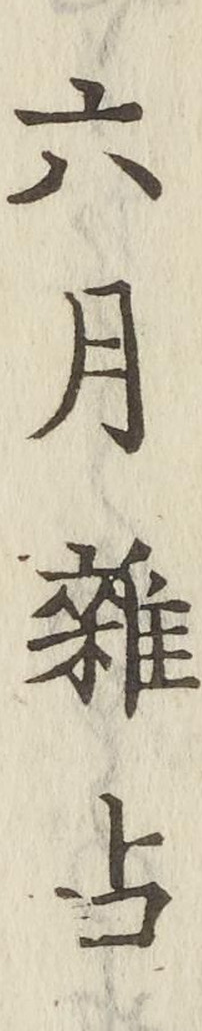六月雑占
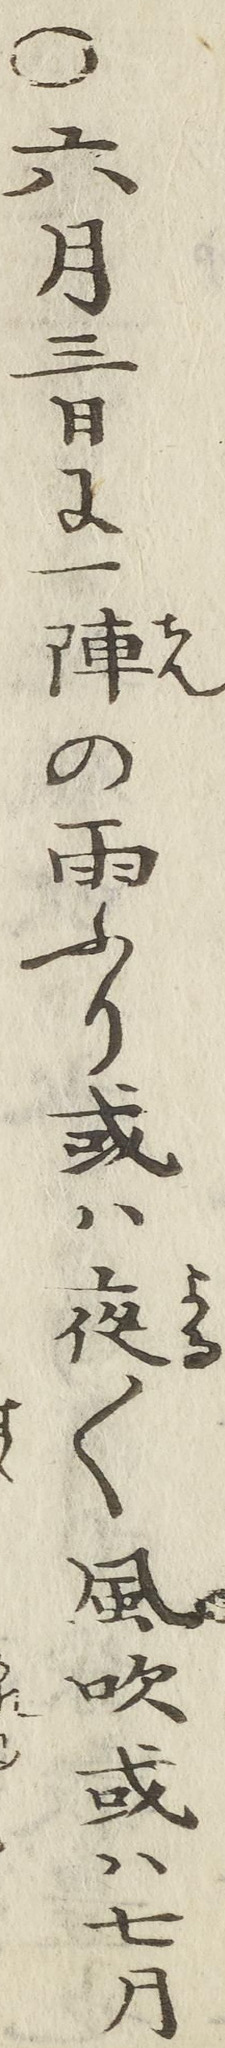○六月三日に一陣の雨ふり或は夜〳〵風吹或は七月
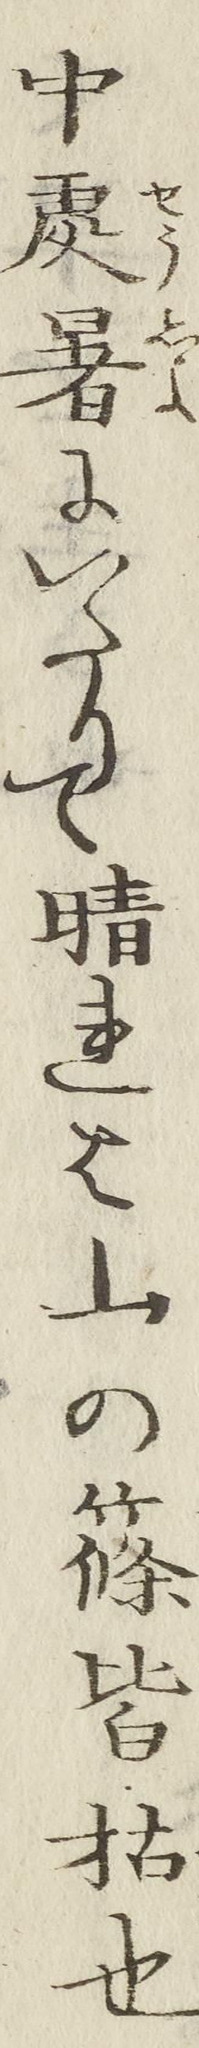中処暑にいたりて晴れは山の篠皆枯也
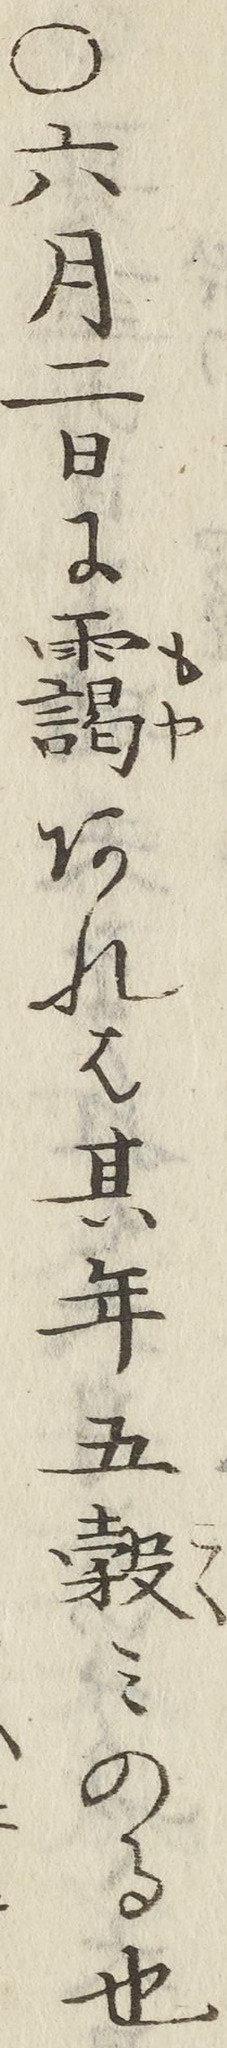○六月二日に靄あれは其年五穀みのる也
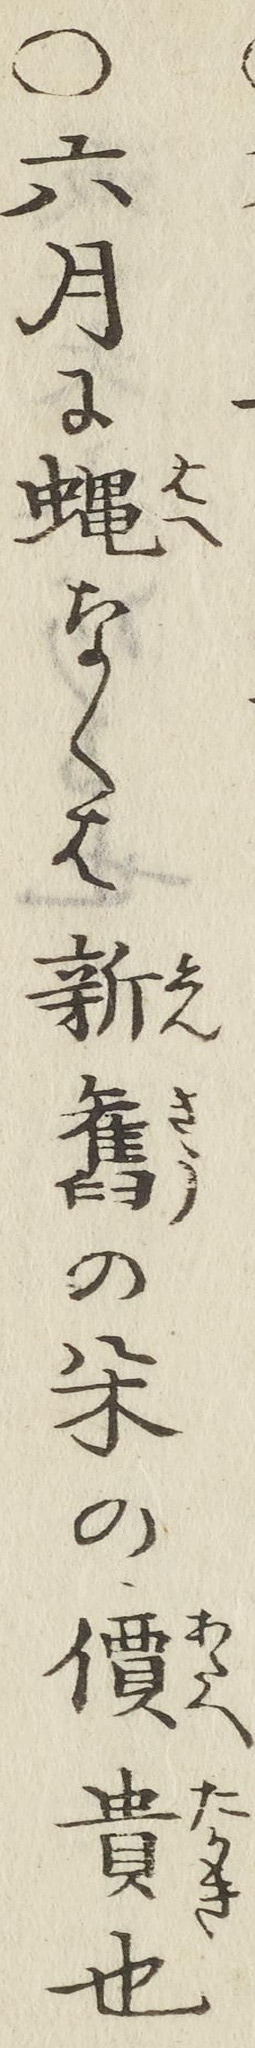○六月に蝿なくは新旧の米の価貴也
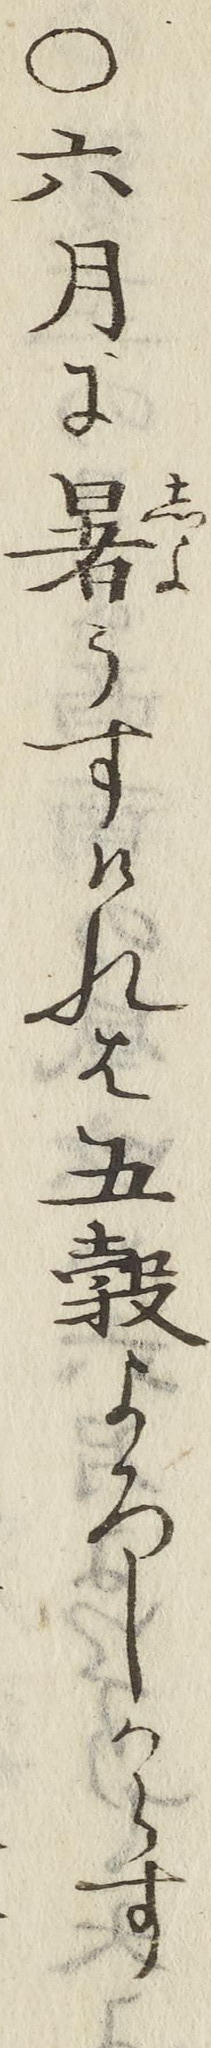○六月に暑うすけれは五穀よろしからす
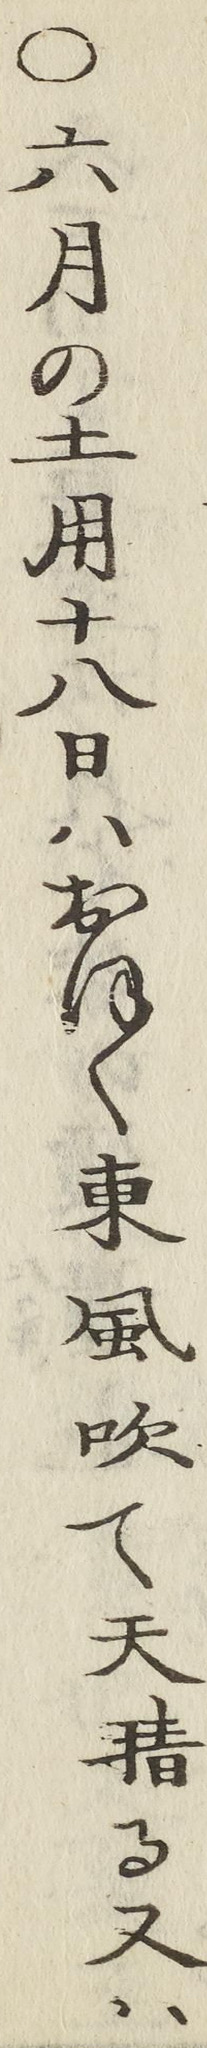○六月の土用十八日はおほく東風吹て天晴る又は
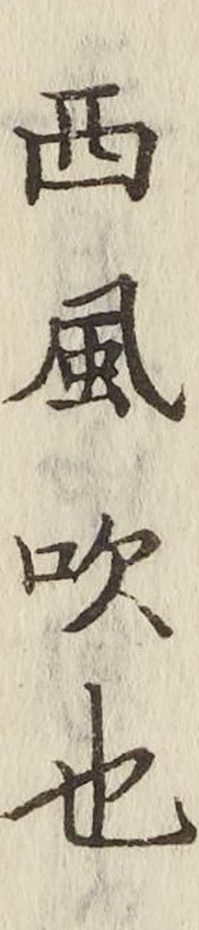西風吹也
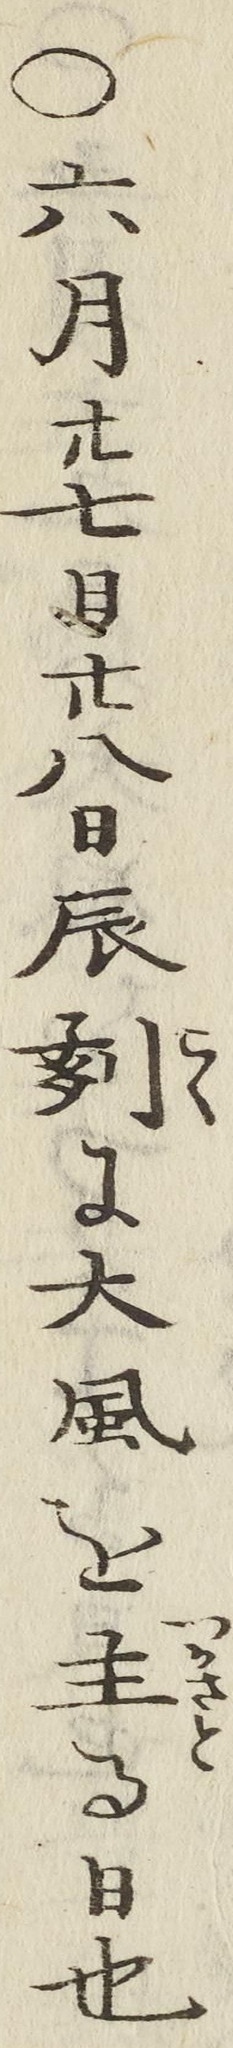○六月廿七日廿八日辰刻に大風を主る也
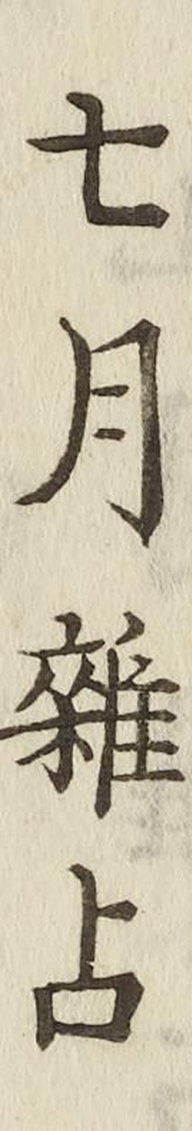七月雑占
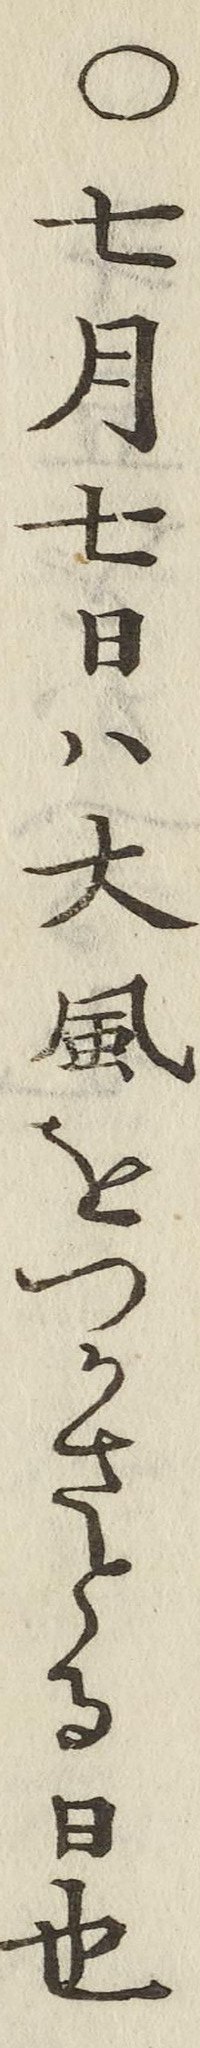○七月七日は大風をつかさとる日也
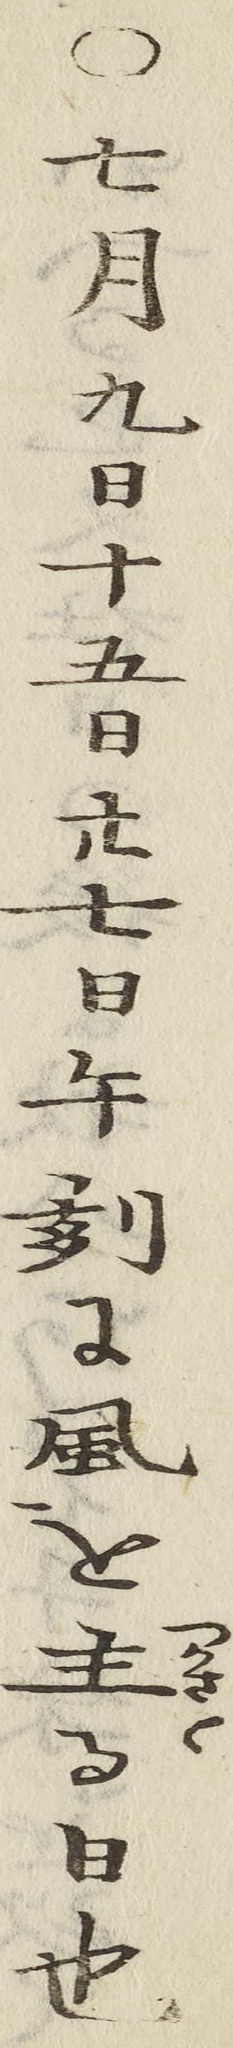○七月九日十五日廿七日午刻に風を主る日也
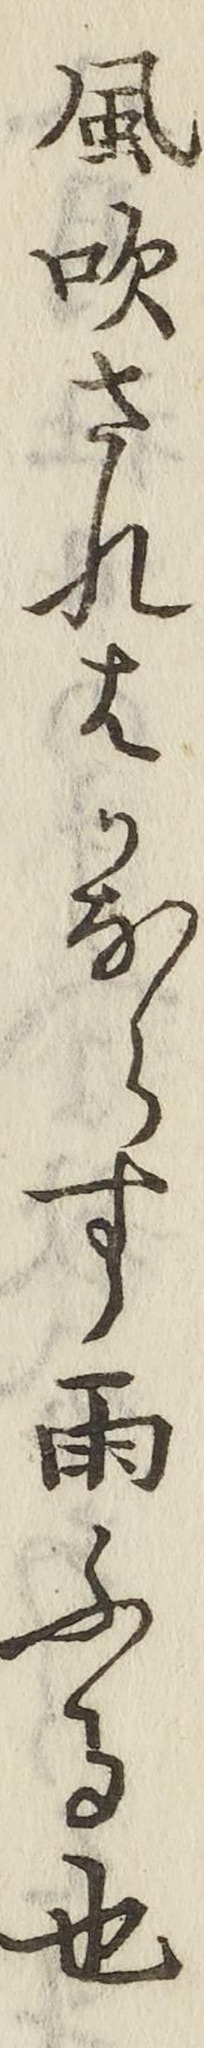風吹されはかならす雨ふる也
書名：天時占候　二
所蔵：東京大学地震研究所図書室 Earthquake Research Institute Library, The University of Tokyo, JAPAN
